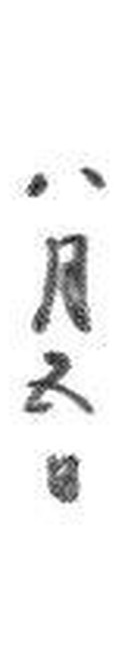八月五日
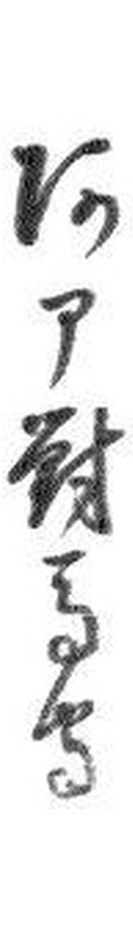阿部対馬守
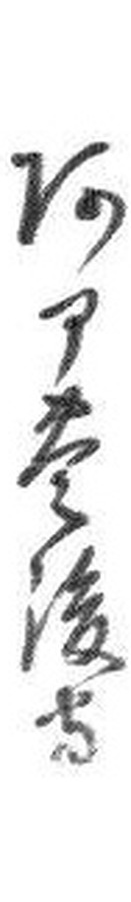阿部豊後守
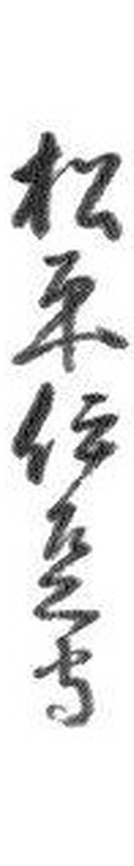松平伊豆守

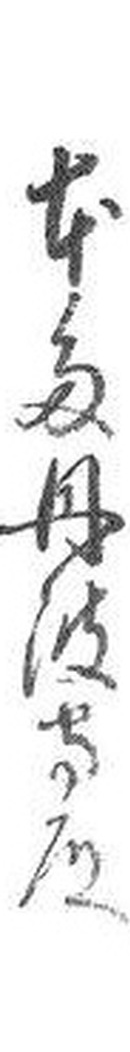本多丹波守殿
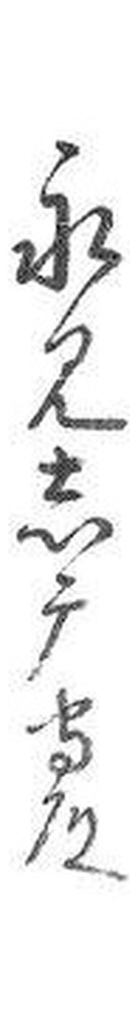永見志摩守殿
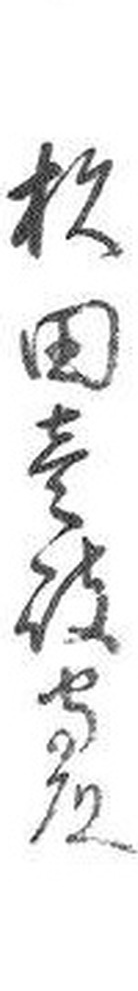杉田壱岐守殿
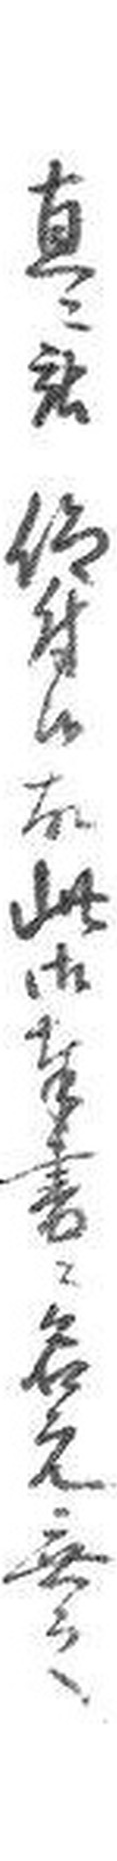直ニ被仰付候故此御奉書ニ名元無之
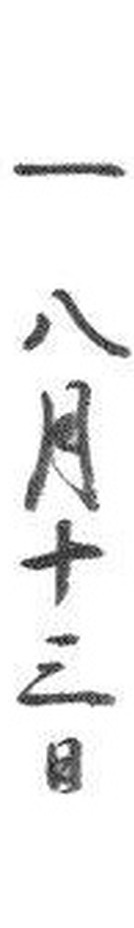一八月十三日
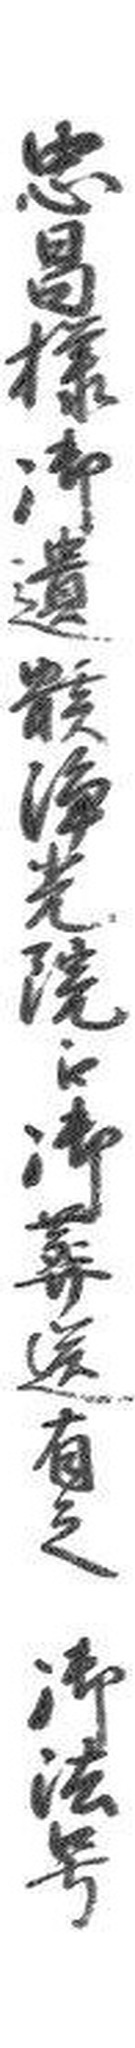忠昌様御遺骸浄光院江御葬送有之御法号
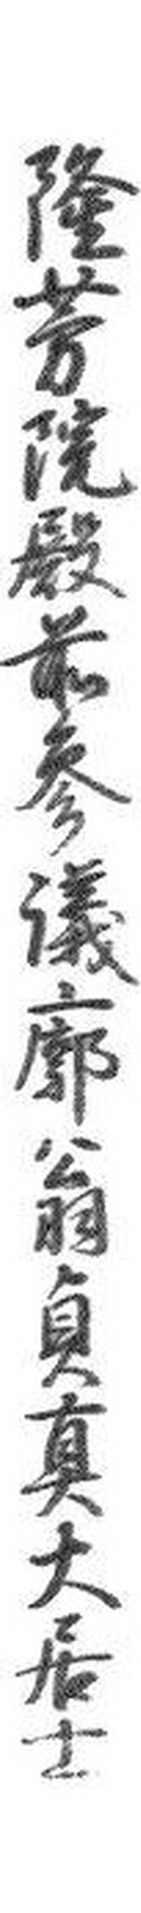隆芳院殿前参議廓翁貞真大居士
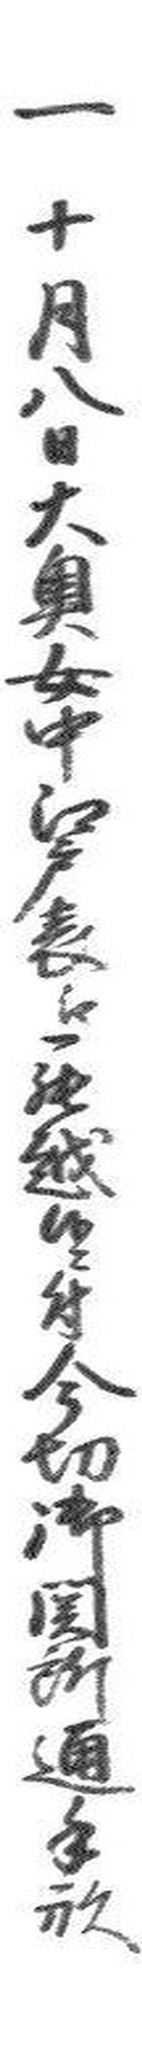一十月八日大奥女中江戸表江罷越候ニ付今切御関所手形
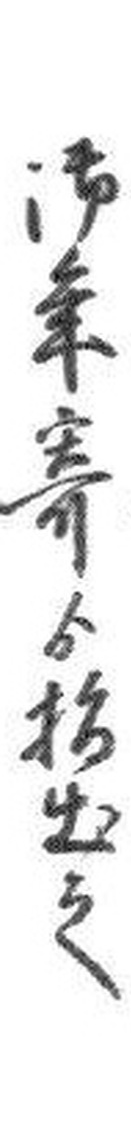御年寄ゟ指出之
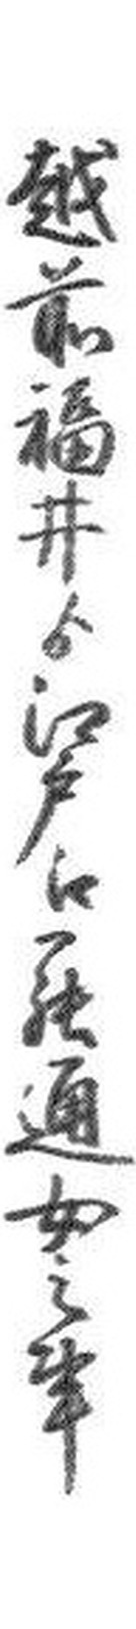越前福井ゟ江戸江罷通女之事
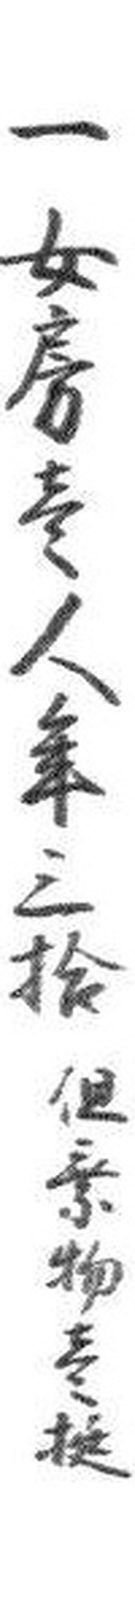一女房壱人年三拾但乗物壱挺
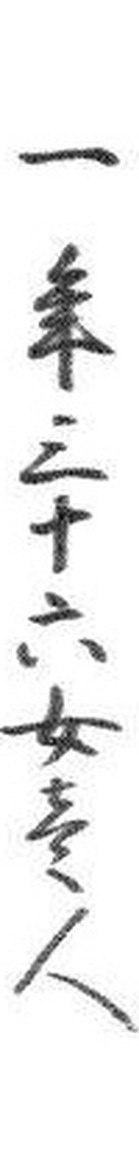一年三十六女壱人
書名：家譜 五 光通公 従寛永十三年到万治二年
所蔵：福井県文書館 Fukui Prefectural Archives
